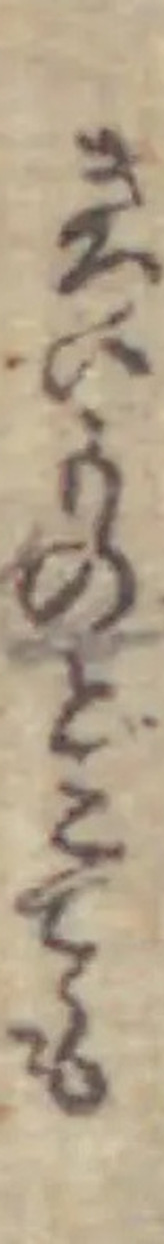きついものどこても
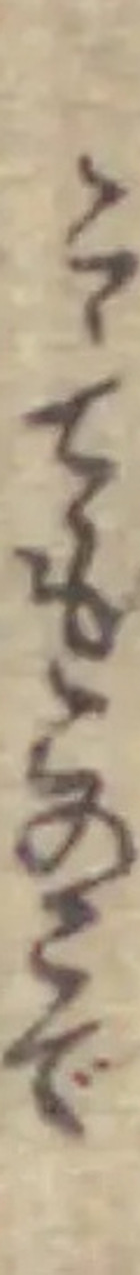こゝてもこのこで
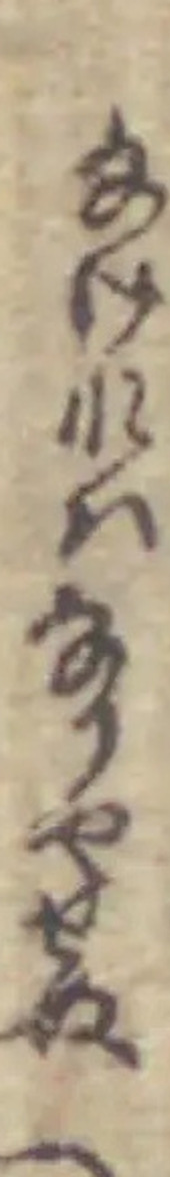なけれはなりやせぬ
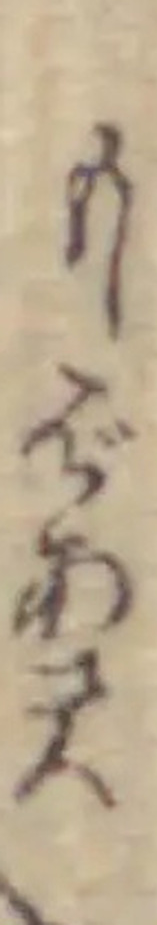もしばあさん
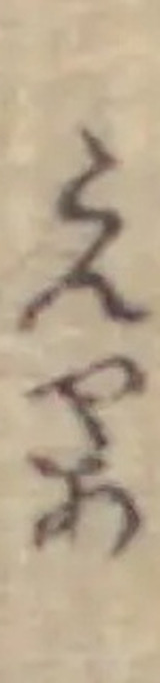こんやあ
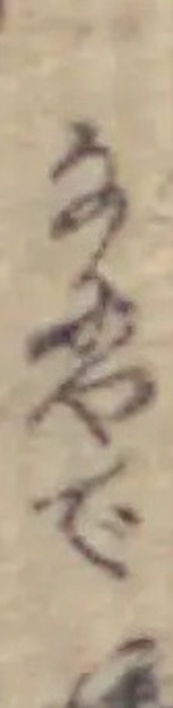なにやで
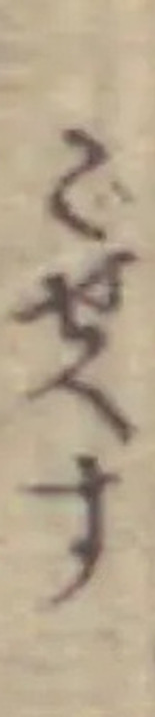ごせへす
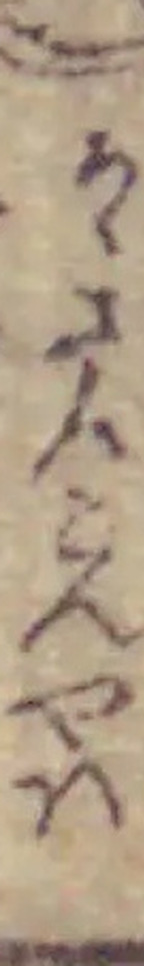かゝさんこんやは
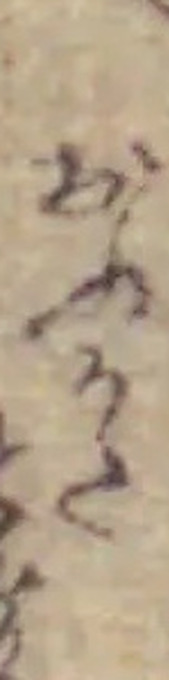おふかた
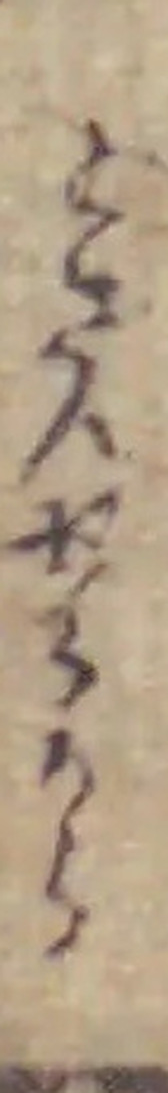ごさんせうから
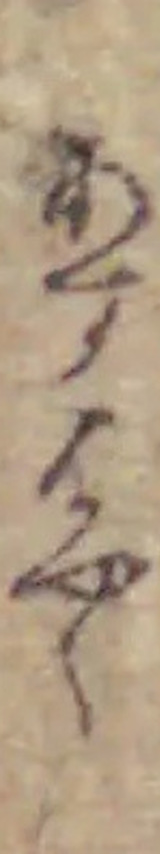あすはやく
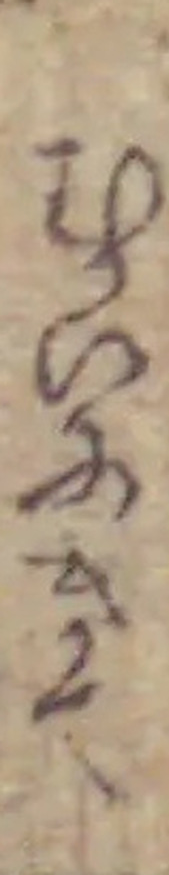むかいにきて
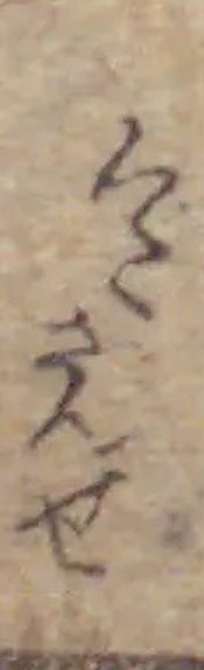くたさんせ

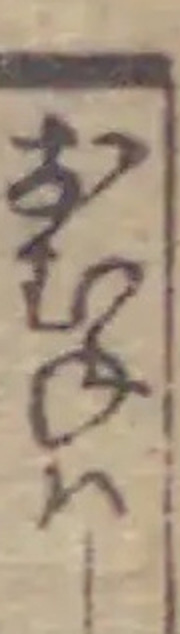おむねは
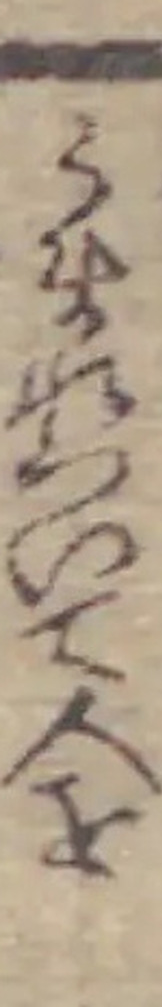うまれついて人を
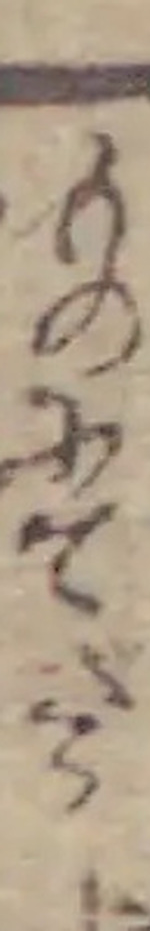ものにてざら
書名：奥州咄 3巻
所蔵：国立国会図書館 National Diet Library, JAPAN
